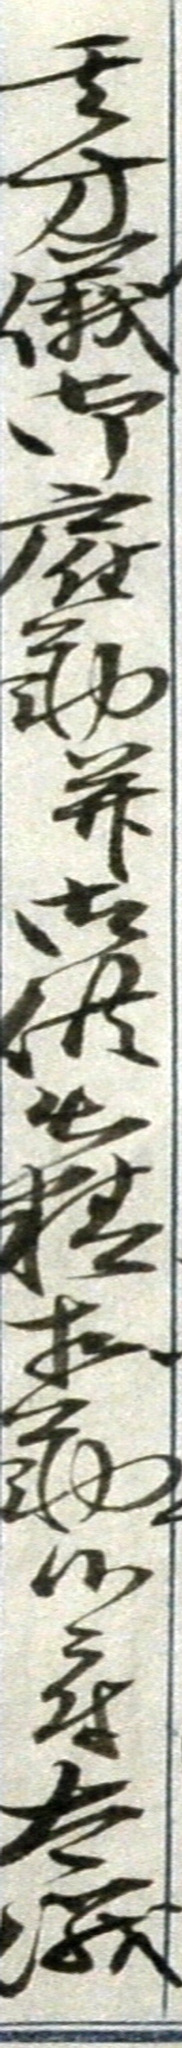其方儀御雇勤幷御供出精相勤候ニ付太儀
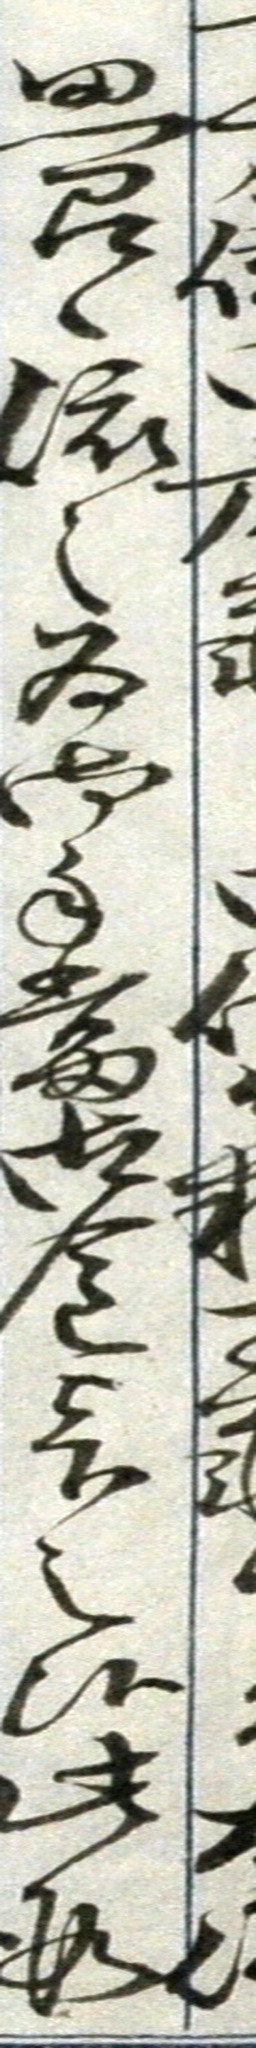思召候依之為御手當御金被下之候此如
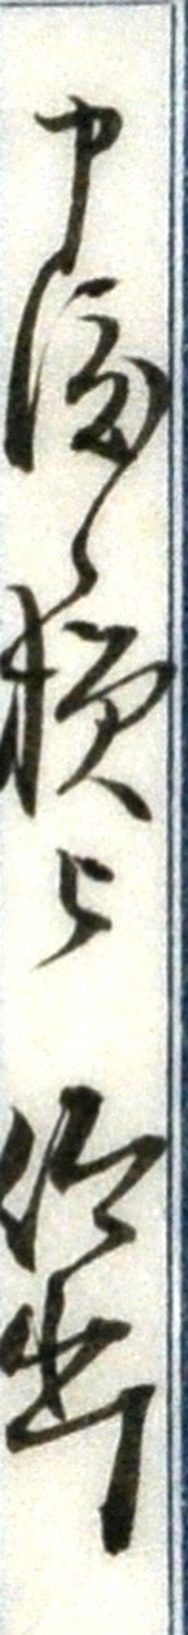申渡候様被仰出候
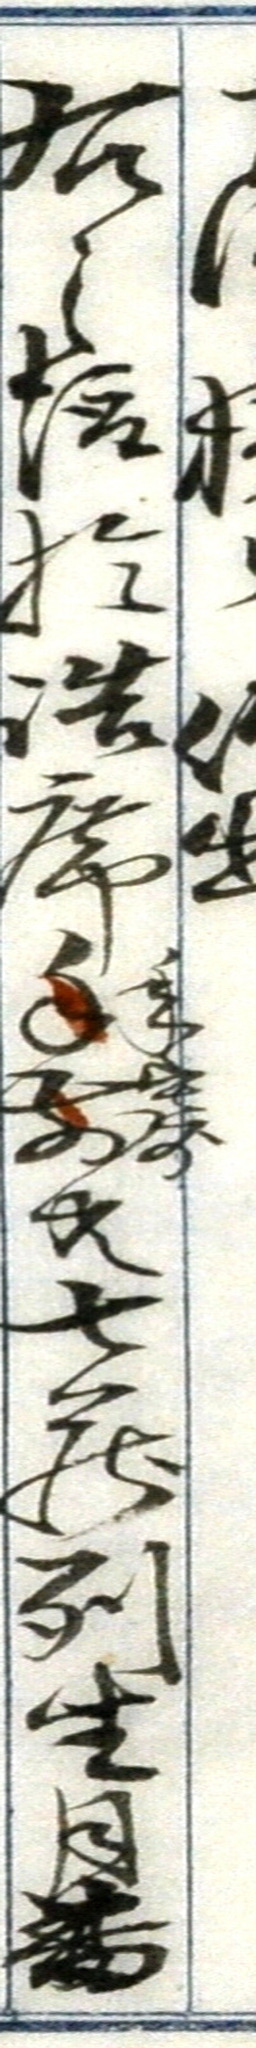右之趣於詰席年寄共七蔵列座月番
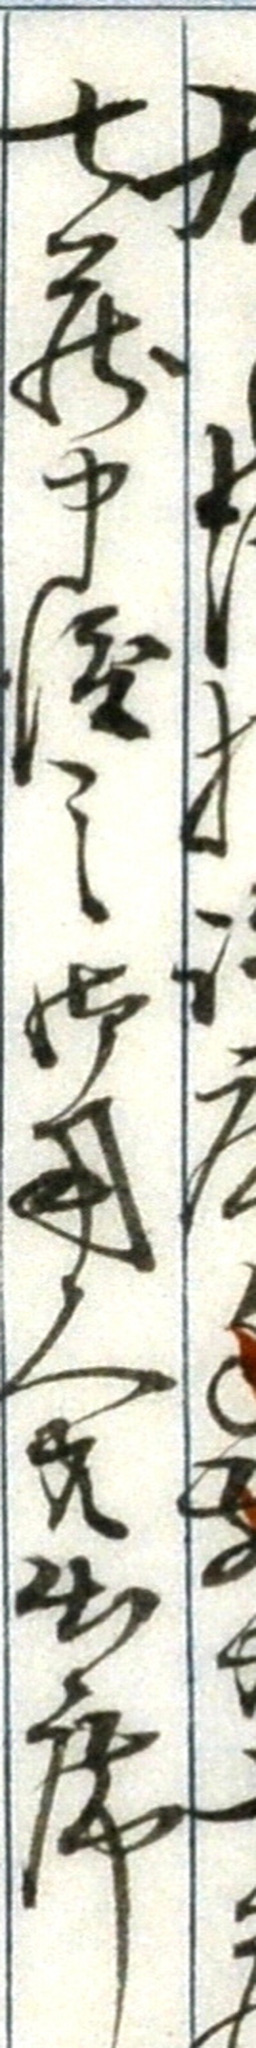七蔵申渡之御用人共出席
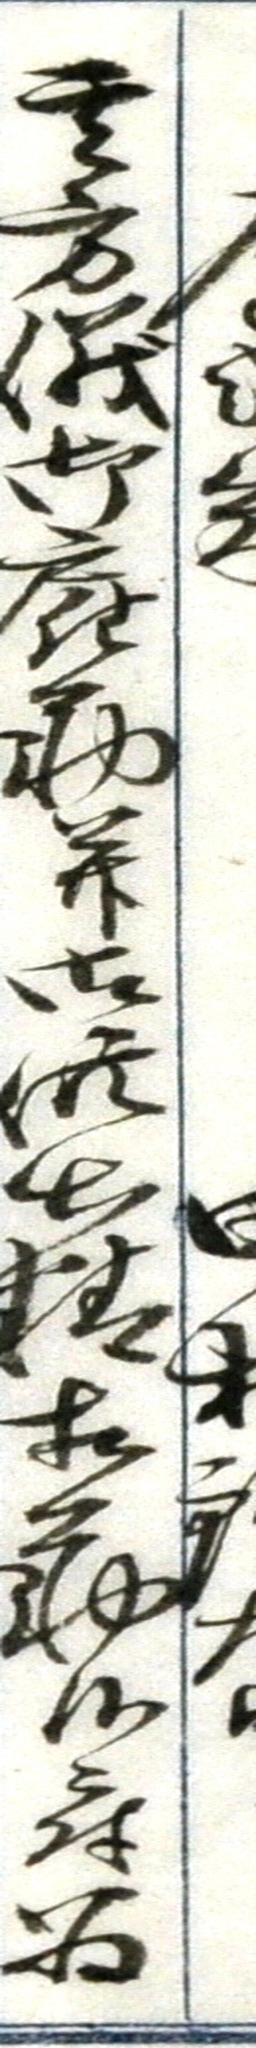其方儀御雇勤幷御供出精相勤候ニ付為
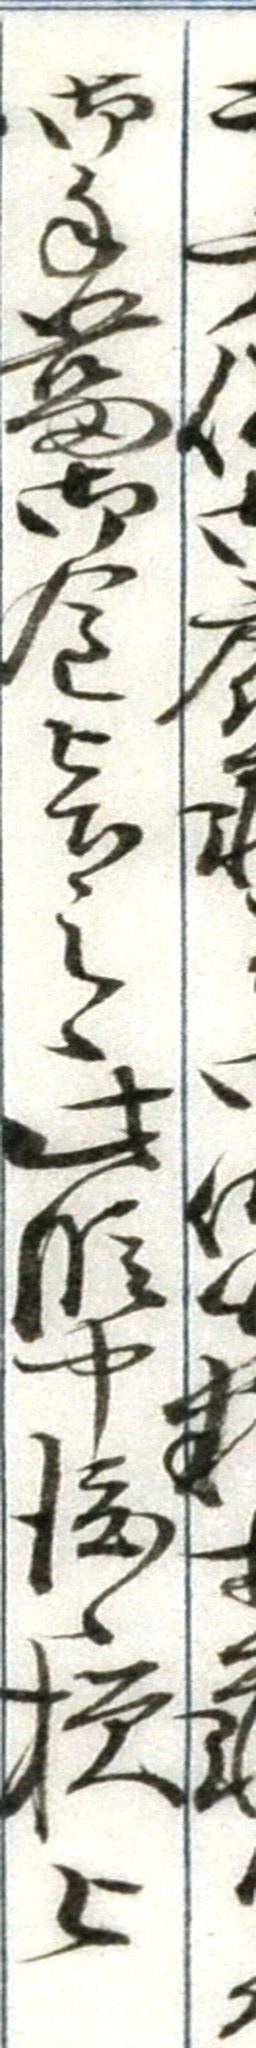御手當御金被下之候此段申渡候様被
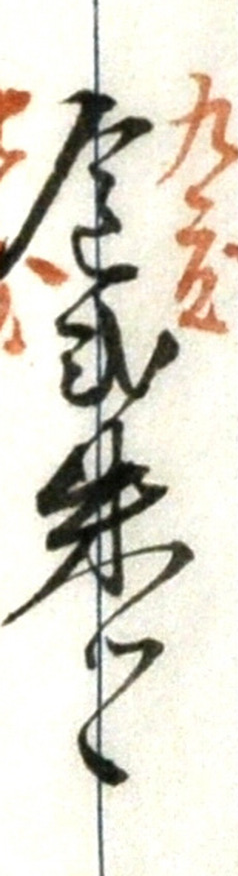金弐朱ツヽ

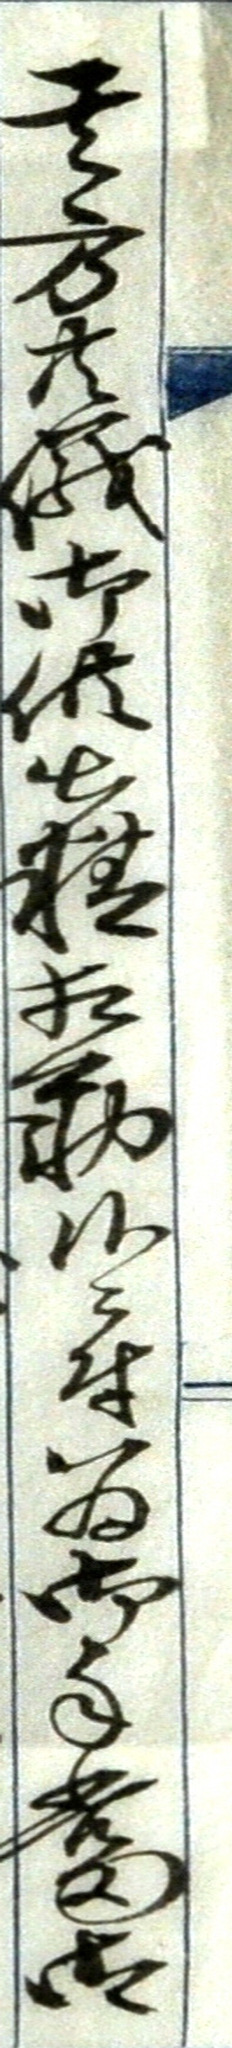其方共儀御供出精相勤候ニ付為御手当當御
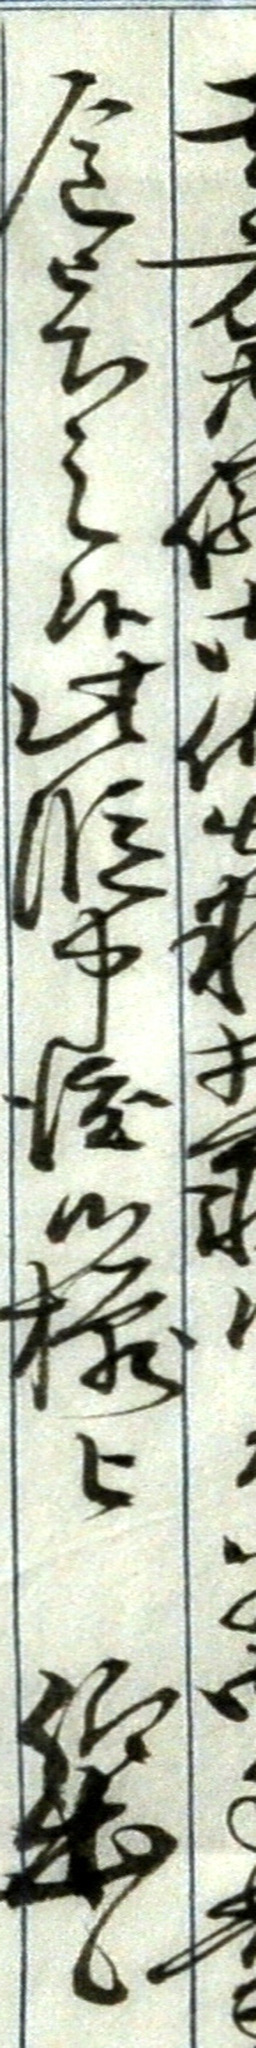金被下之候此段申渡候様被仰出候
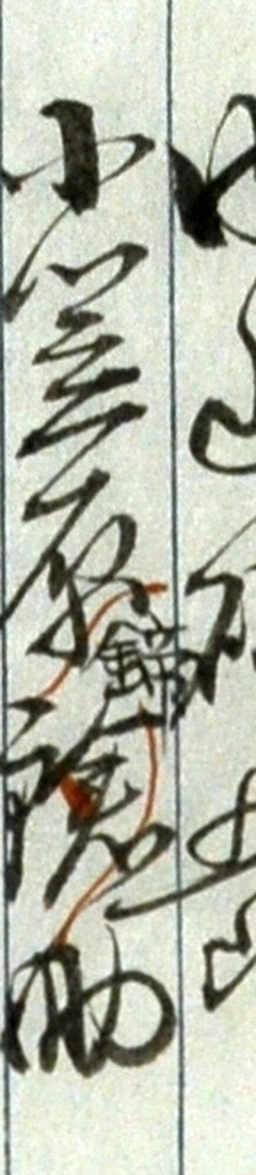小笠原鎗助
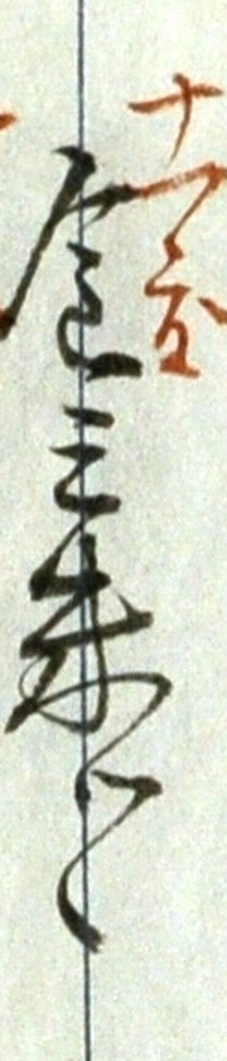金三朱ツヽ
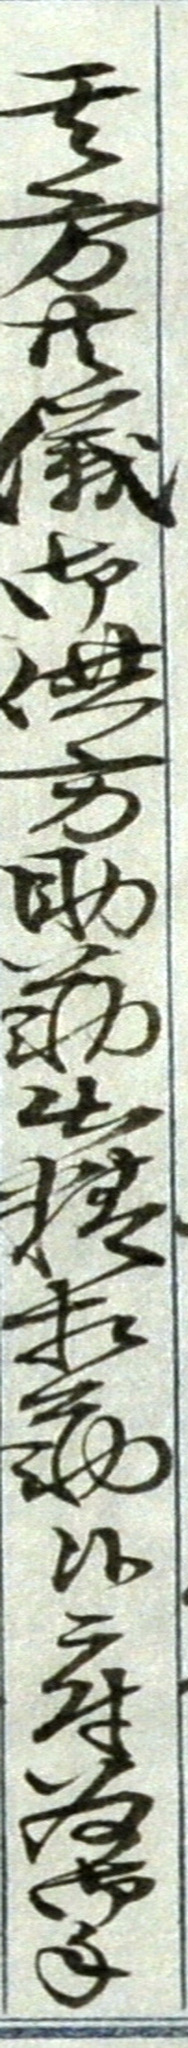其方共儀御供方助勤出精相勤候ニ付為御手
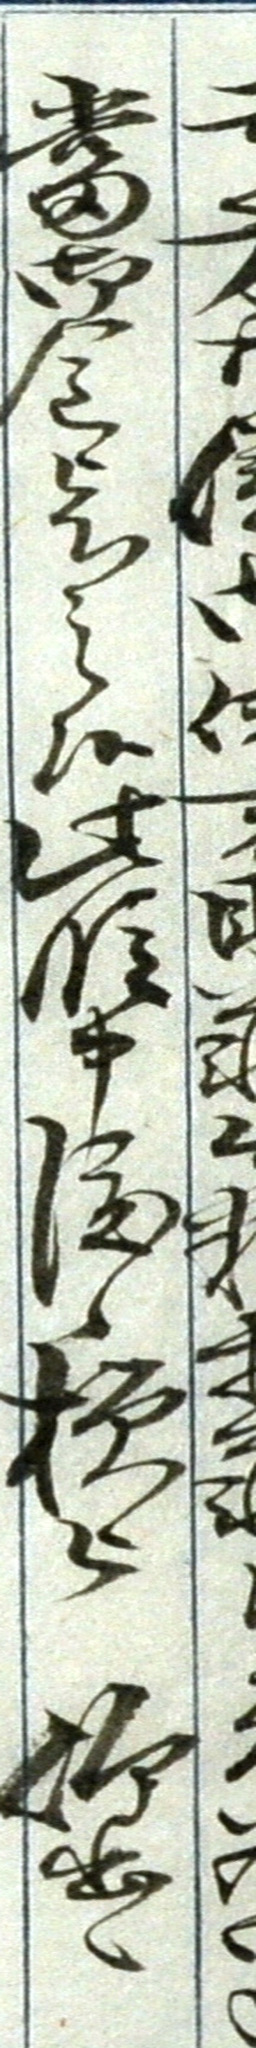當御金被下之候此段申渡候様被仰出候
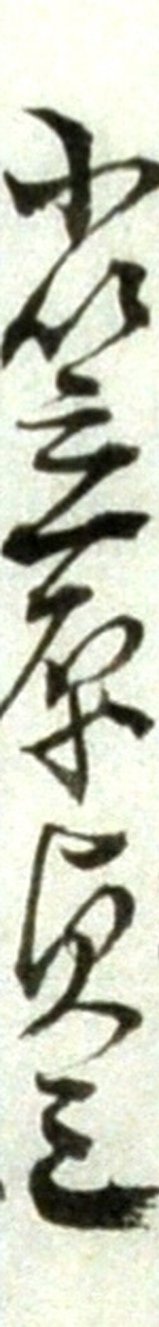小笠原鎗助
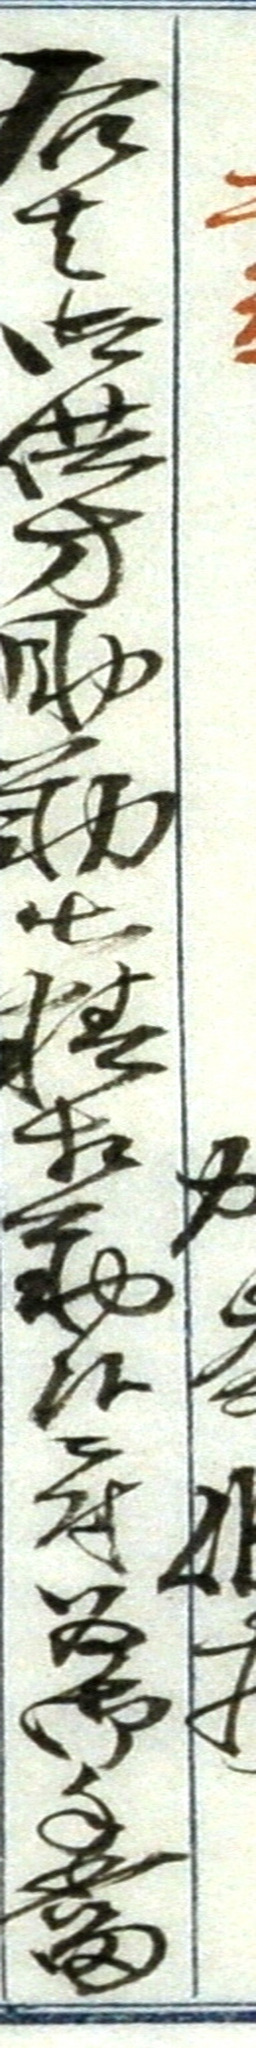右者御供方助勤出精相勤候ニ付為御手當
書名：上方ヨリ御帰府之後江戸勤并江戸在番中之者江被下・控
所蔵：伊那市立高遠町図書館・合同会社AMANE
